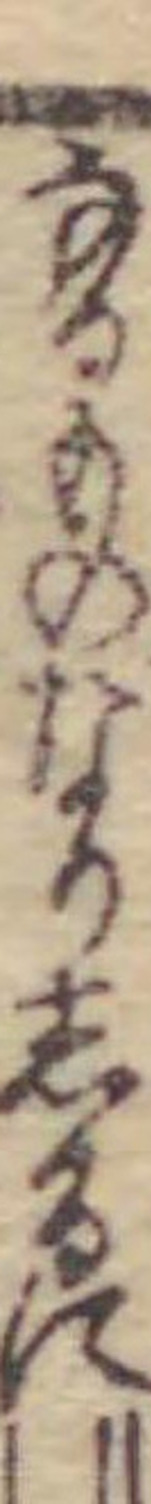なるものなりしかるに
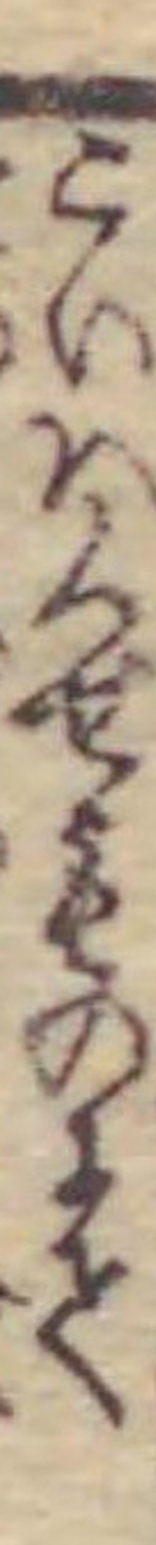こいはくせものにて
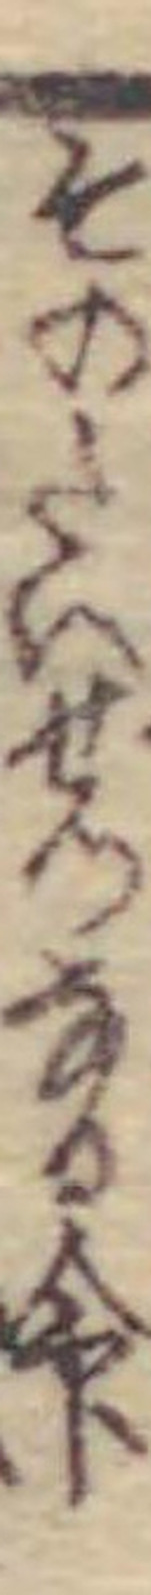そのたいせつなる命
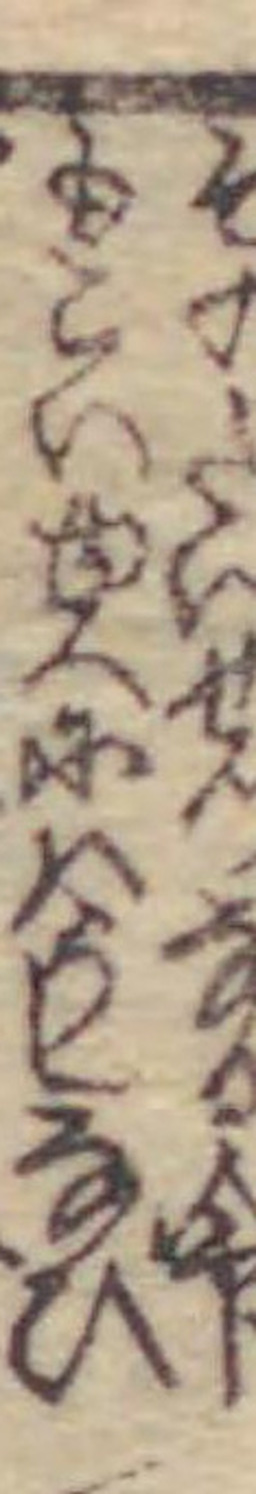もこいゆへにはうしなひ
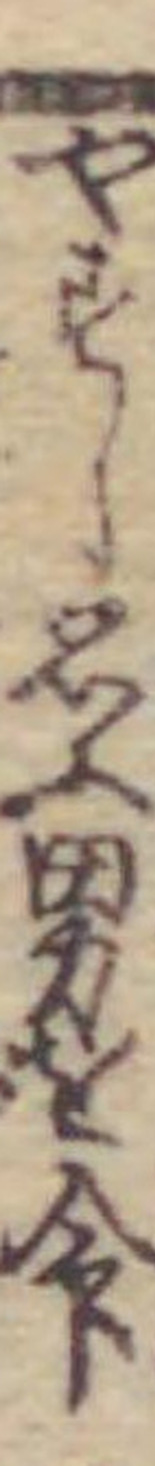やすし思ふ男を命
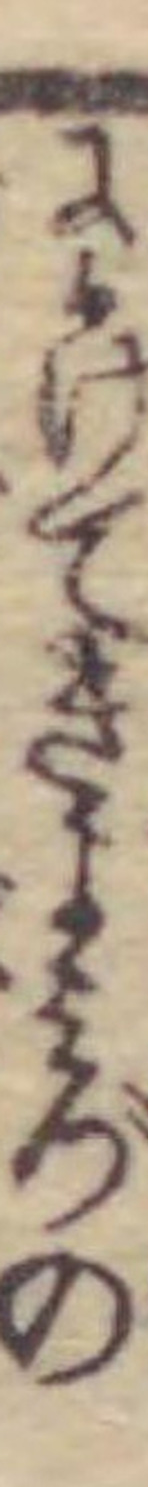にかけてきよみづの
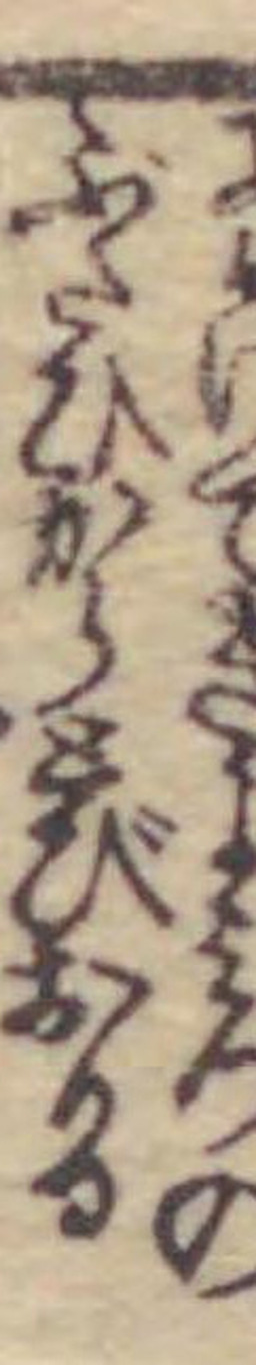ぶたひからとびおりる
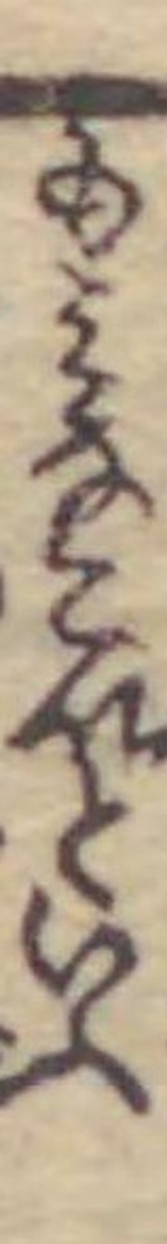もみなこいといふ
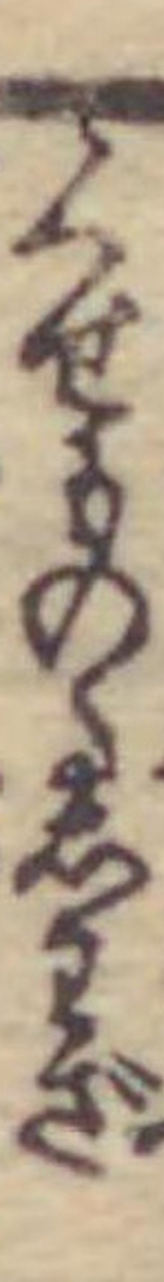くせものゝしわざ
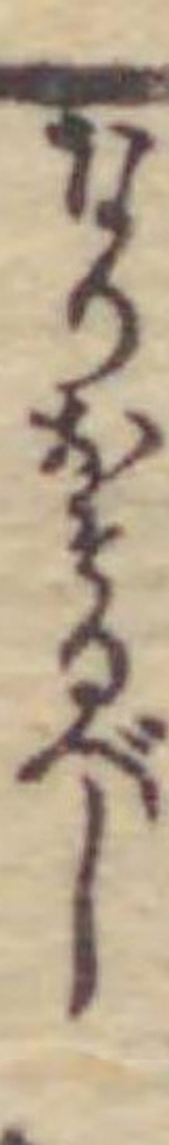なりおそるべし
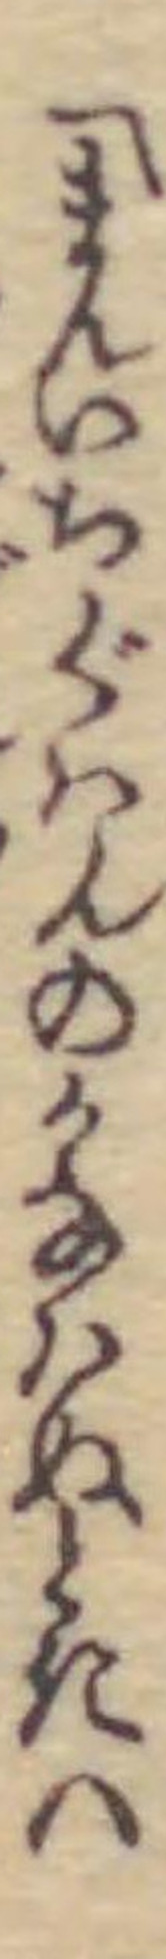〽まんいちぐはんのかなはぬときは
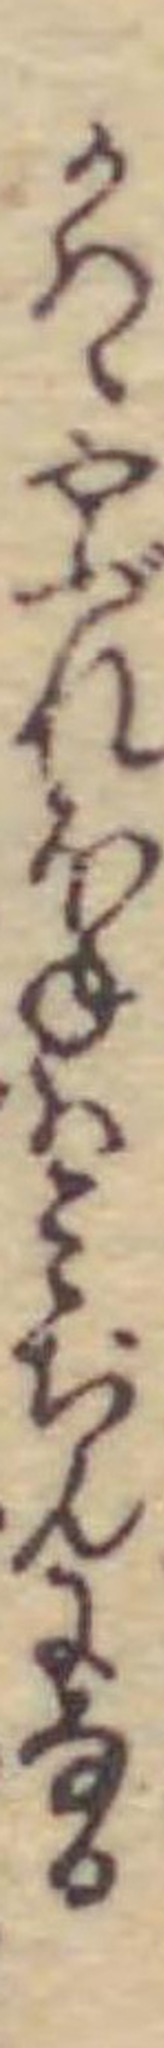かはゝやぶれほねはみぢんになる
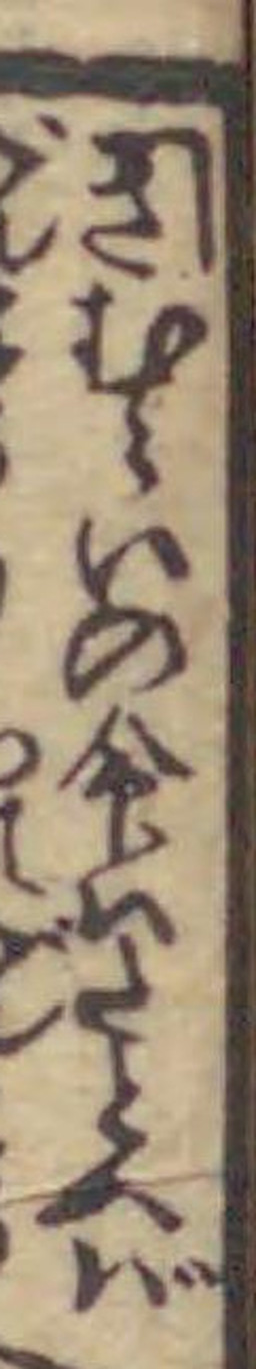〽さむらいの命はたとへば
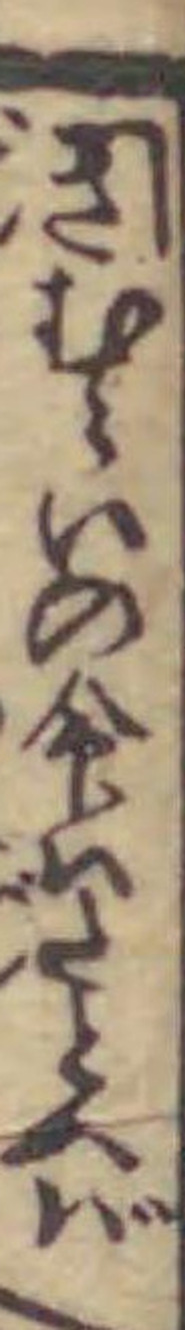〽さむらいの命はたとへば
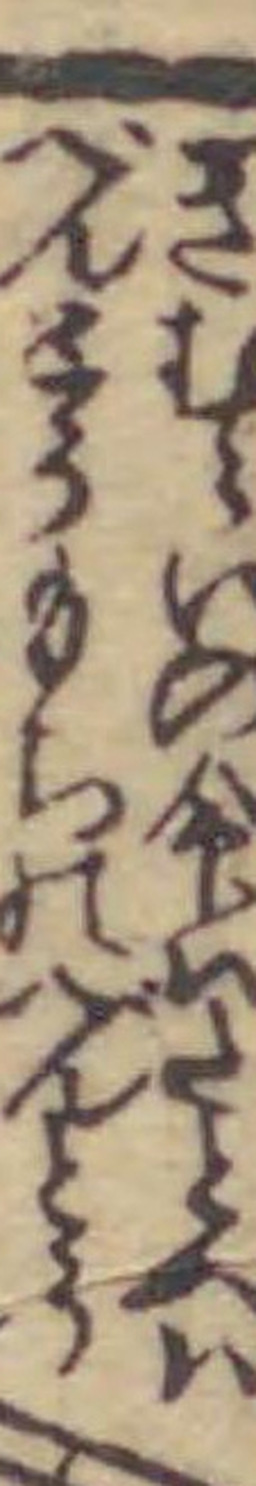べんとうもちのべんとう
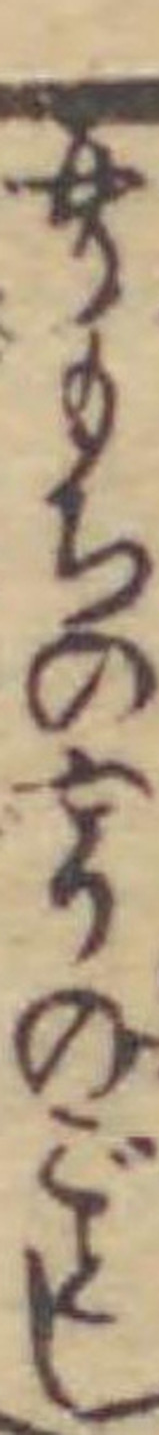やりもちのやりのごとし
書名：御誂染長寿小紋 : 3巻
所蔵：国立国会図書館 National Diet Library, JAPAN
